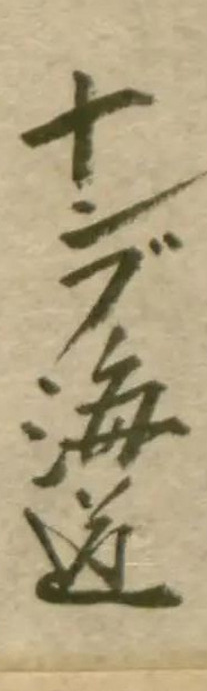ナンブ海道
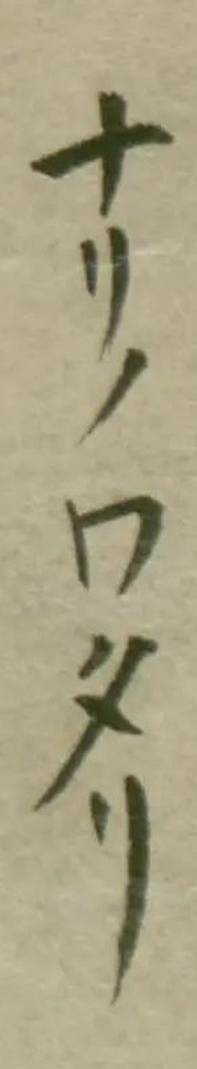十リノワタリ
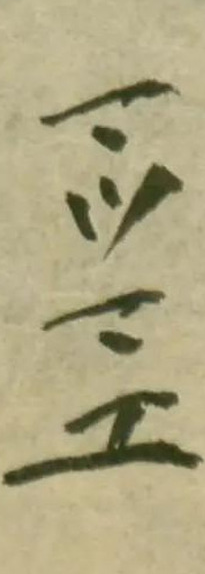マツマエ
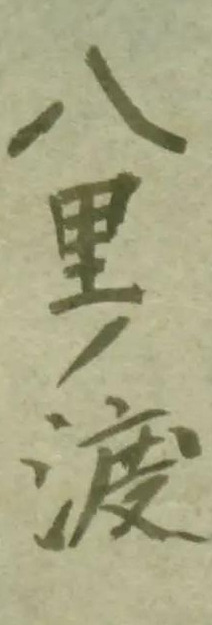八里ノ渡
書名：江戸より奥州津輕迄道筋之圖
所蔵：国立国会図書館 National Diet Library, JAPAN
